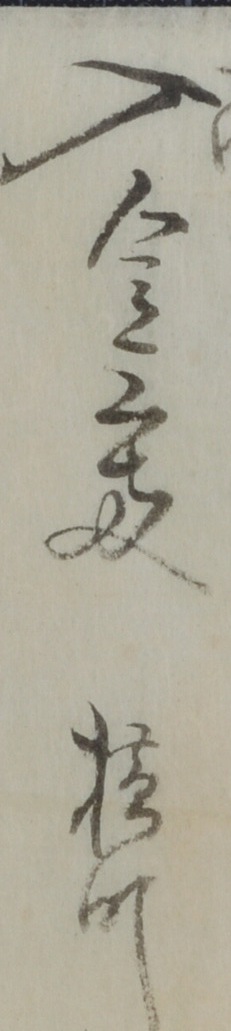入金三両横町
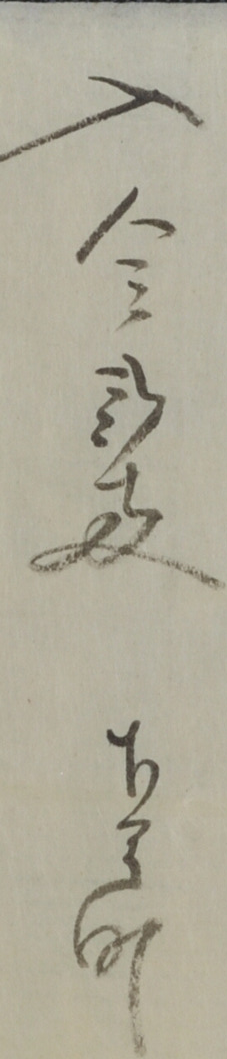入金弐両下モ町
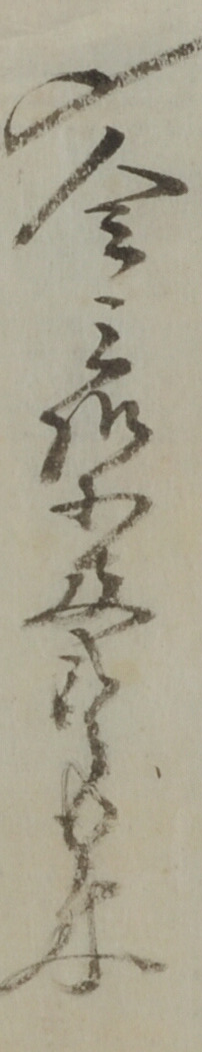〆金三拾五両弐分弐朱
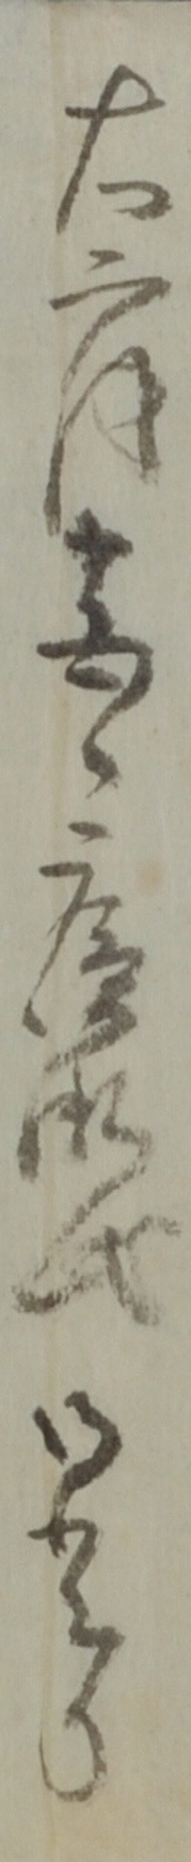右二月十五日広瀬氏御とり
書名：江戸御上屋鋪御類焼ニ付拾町より献金取集帳
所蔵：伊那市立高遠町図書館・合同会社AMANE
